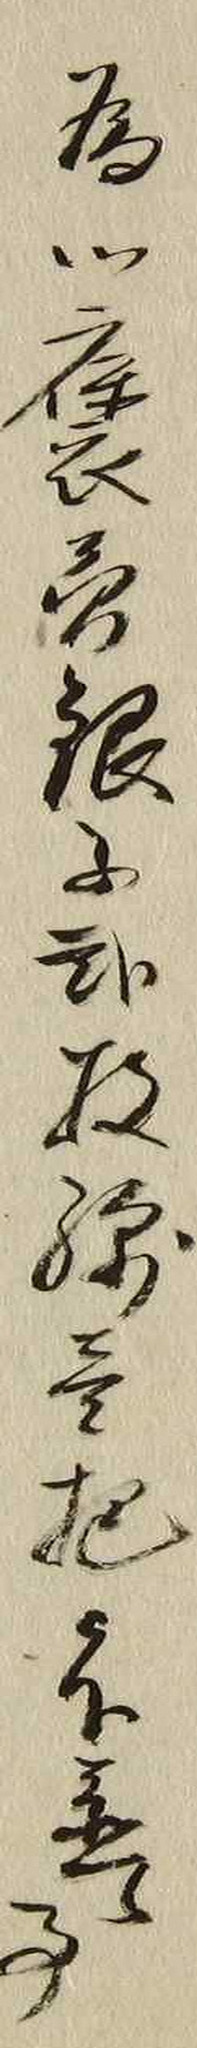為御褒美銀子弐枚綿壱把被下置候事
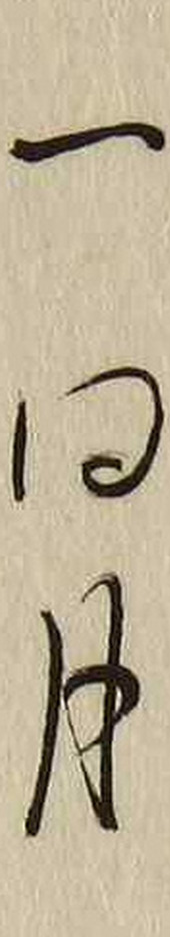一同月
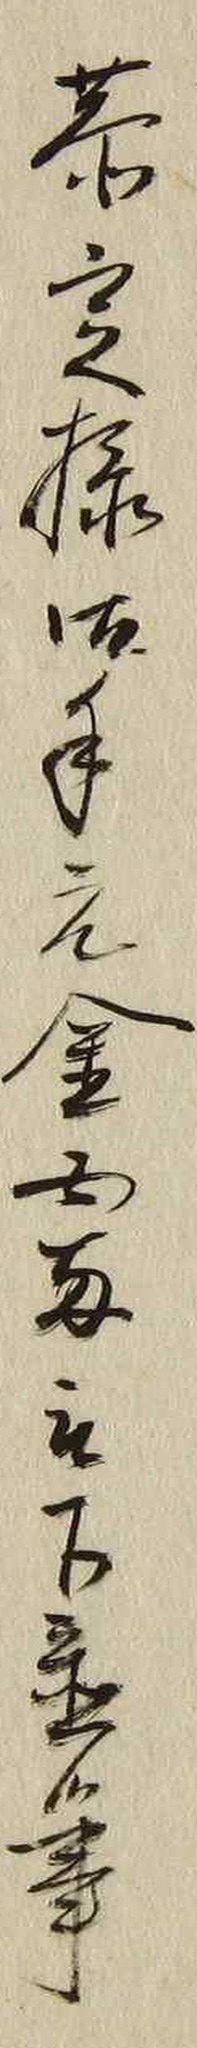恭定様御手元金五両被下置候事
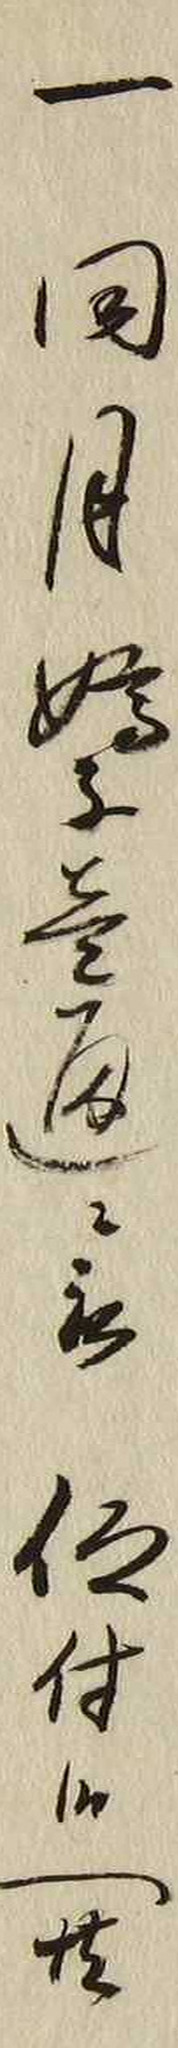一同月嫡子壱通ニ被仰付候へ共
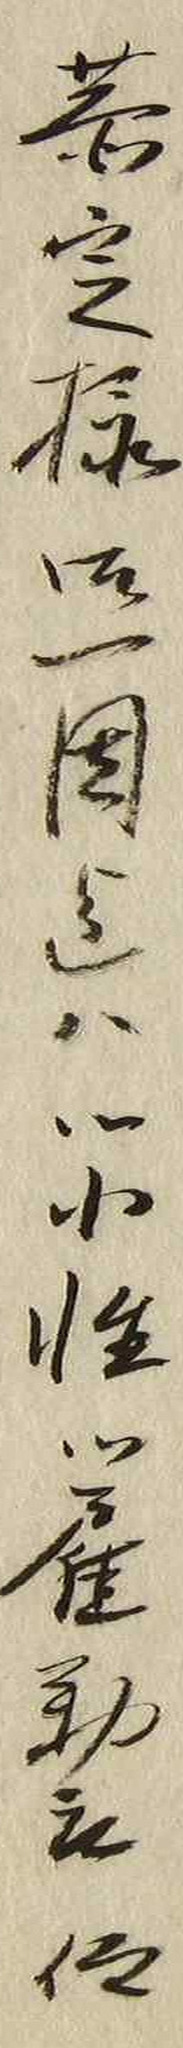恭定様御一周迄ハ御小性御雇勤被仰
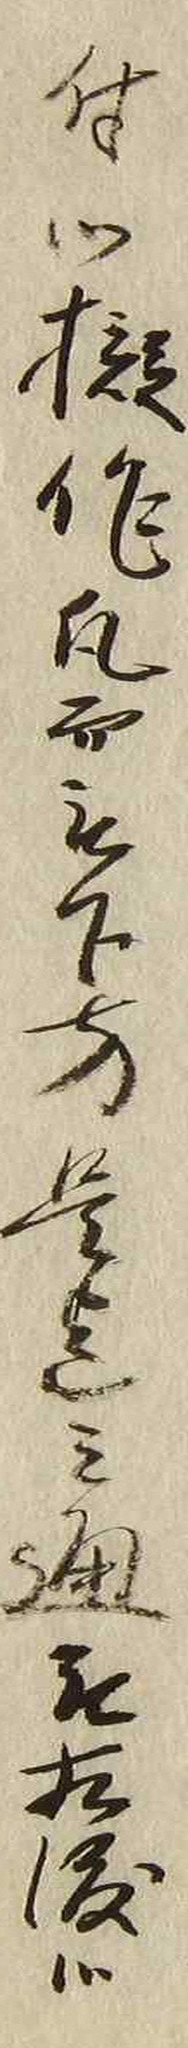付御擬作凡而被下方是迄之通被相渡候
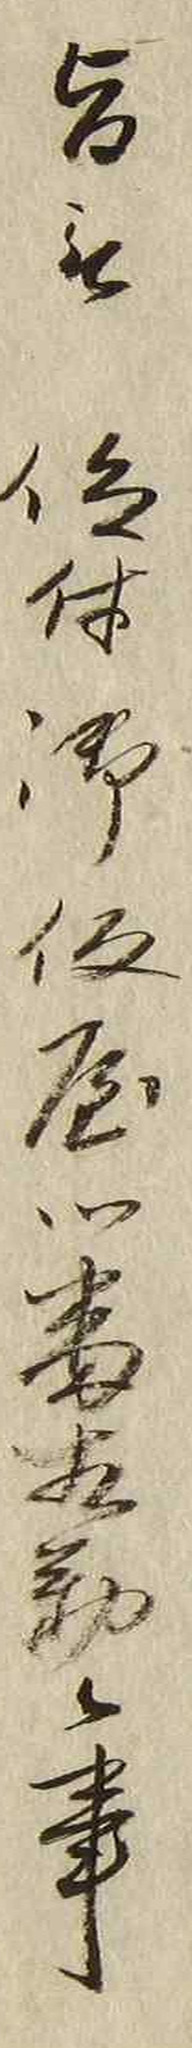旨被仰付御仮屋御番相勤候事

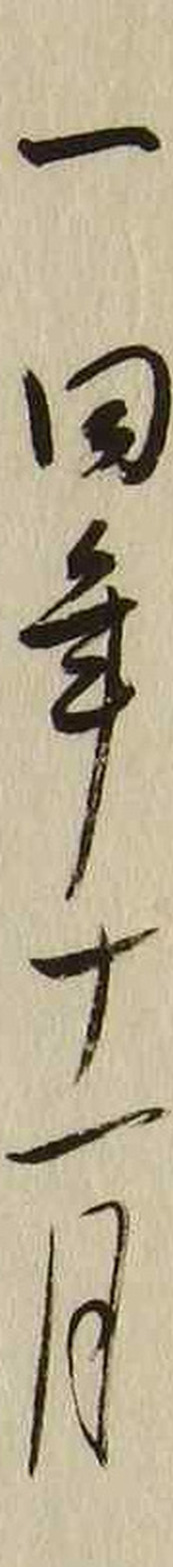一同年十一月
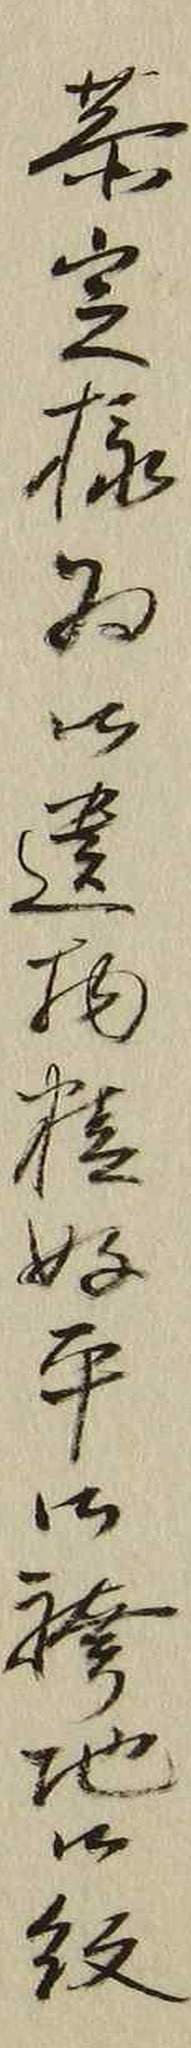恭定様為御遺物精好平御袴地御紋
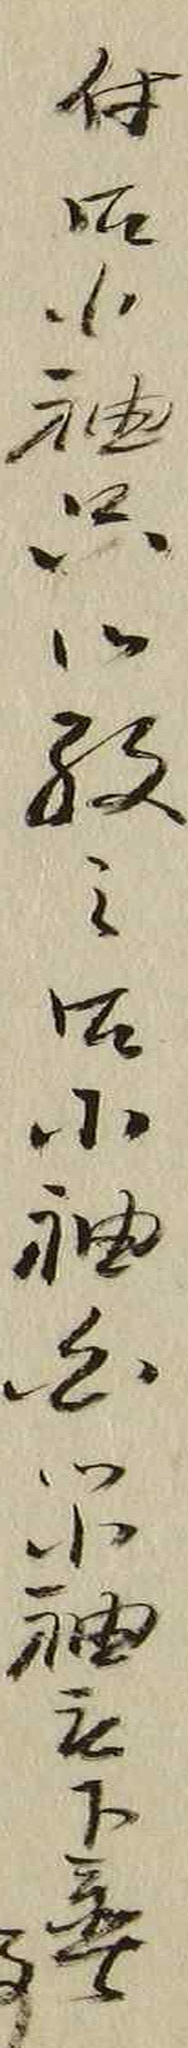付御小袖只御紋之御小袖白御小袖被下置候事
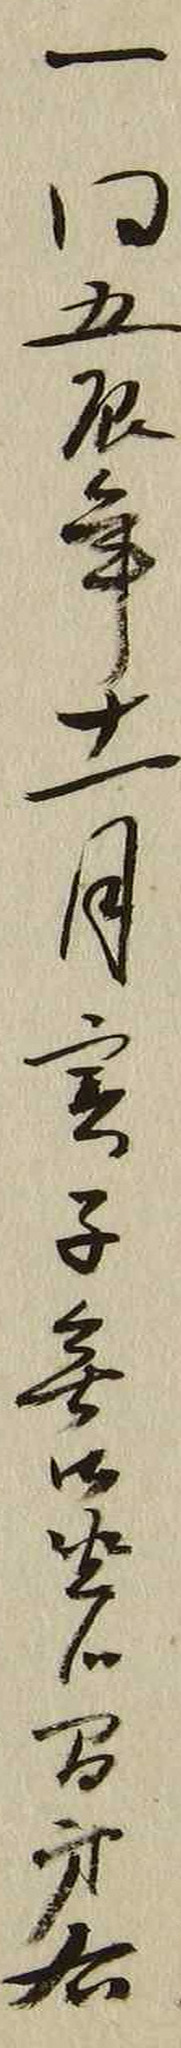一同五辰年十一月実子無御坐候間弟右
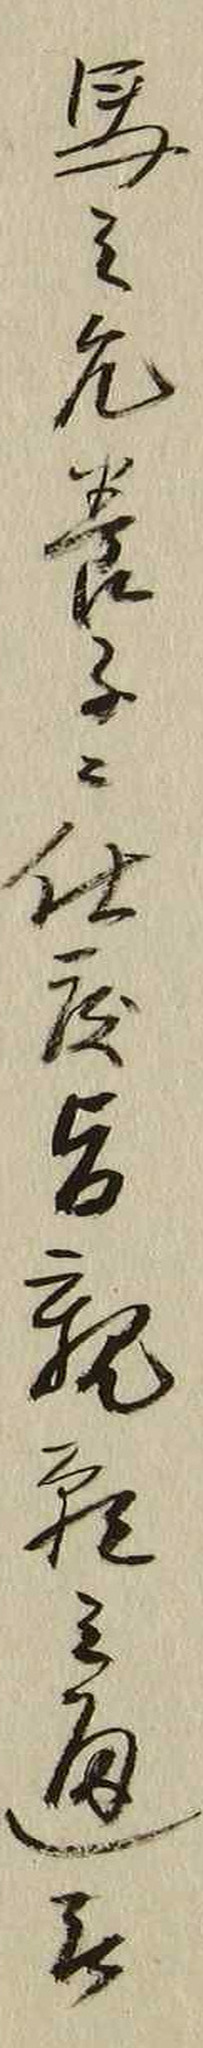馬之允養子ニ仕度旨親願之通被
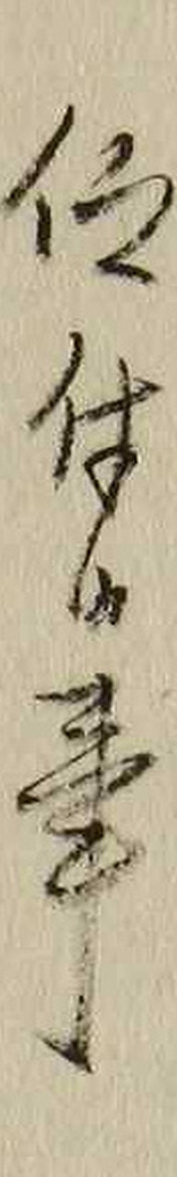仰付候事
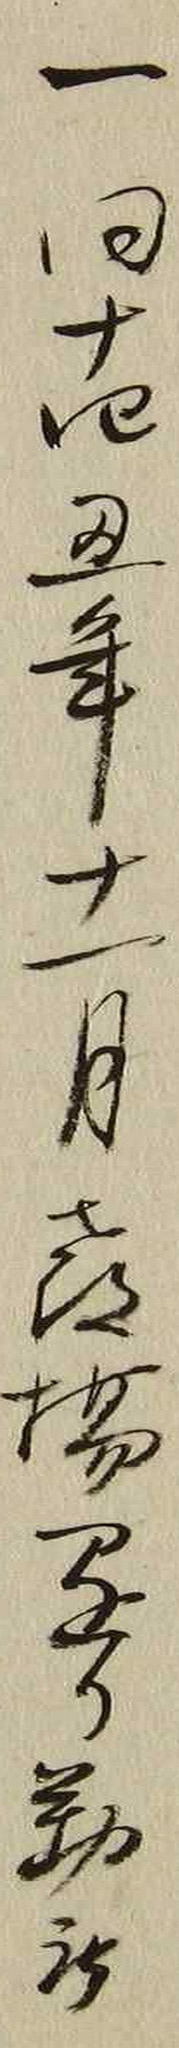一同十四丑年十一月教場懸り勤被
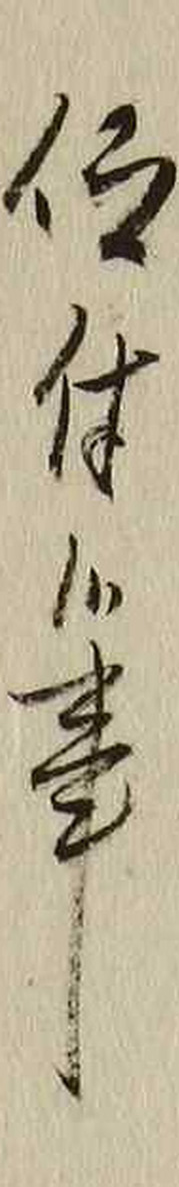仰付候事
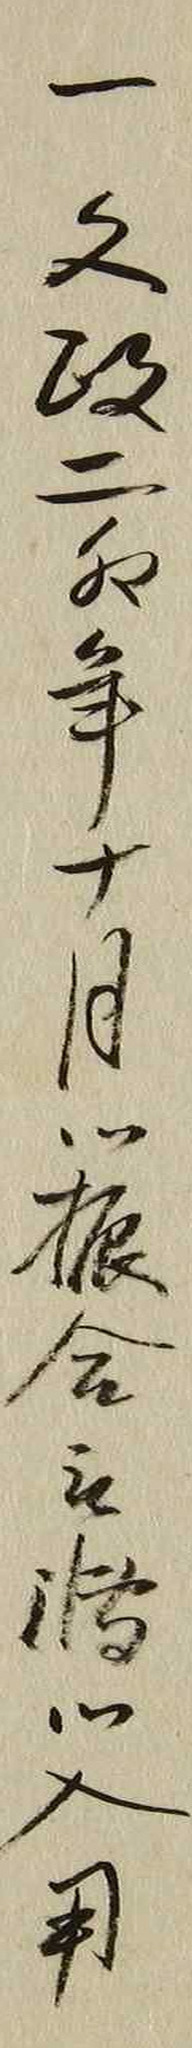一文政二卯年十月御振合被転御入用
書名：諸士系譜　巻之345　も之部1
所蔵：会津若松市立会津図書館
